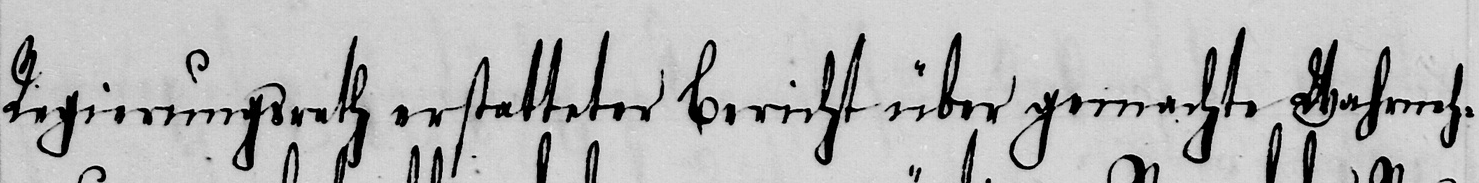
Regierungsrath erstatteter Bericht über gemachte Wahrneh¬
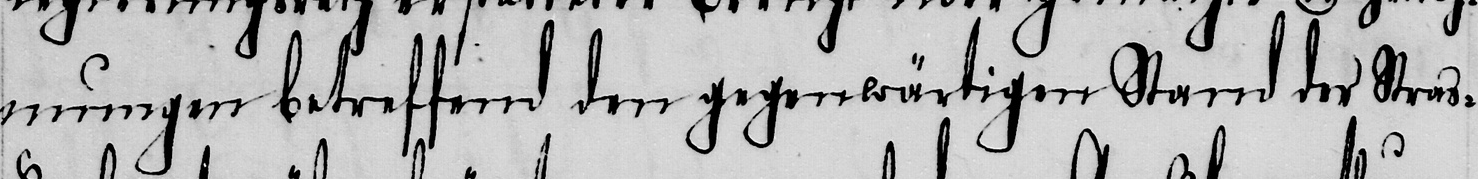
mungen betreffend den gegenwärtigen Stand der Stra¬
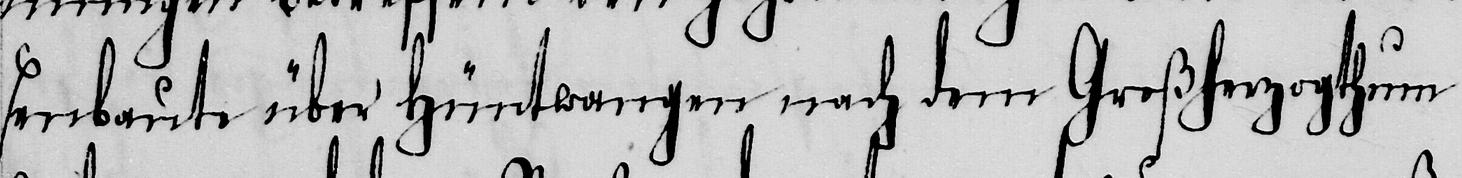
ßenbaute über Hüntwangen nach dem Großherzogthum
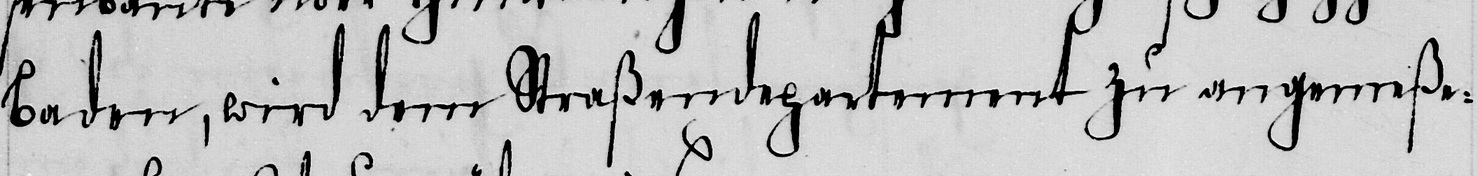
Baden, wird dem Straßendepartement zu angemeße¬
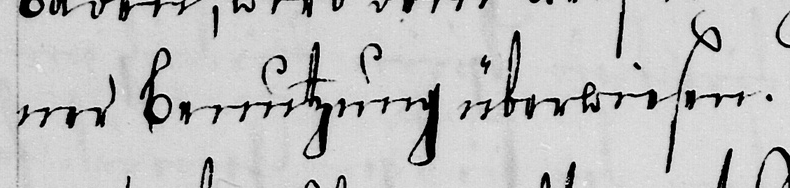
ner Benutzung überwiesen.
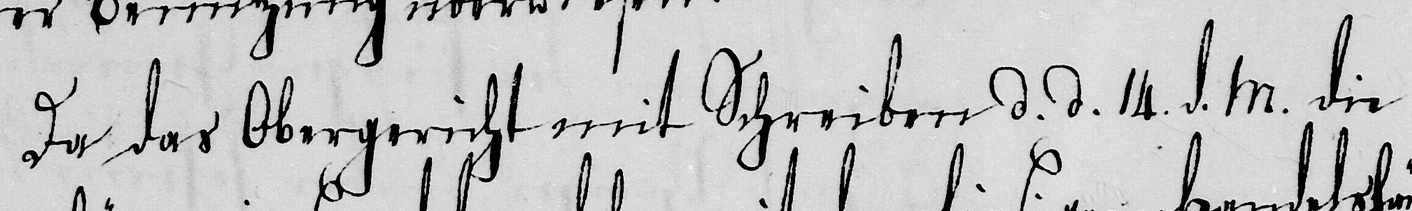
Da das Obergericht mit Schreiben d. d. 14. d. M. die
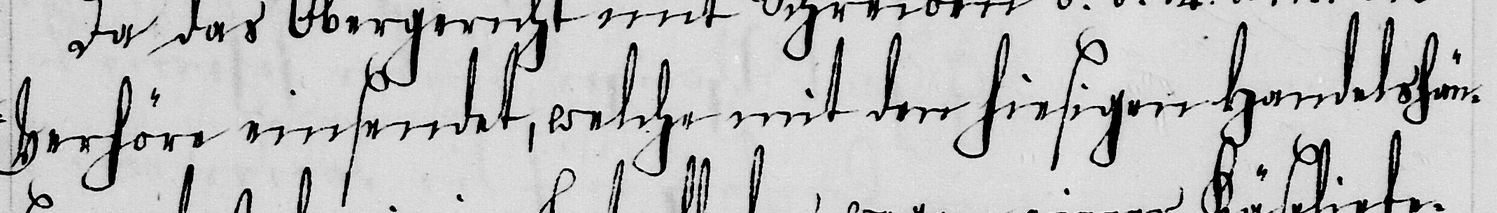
Verhöre einsendet, welche mit den hiesigen Handelshäu¬
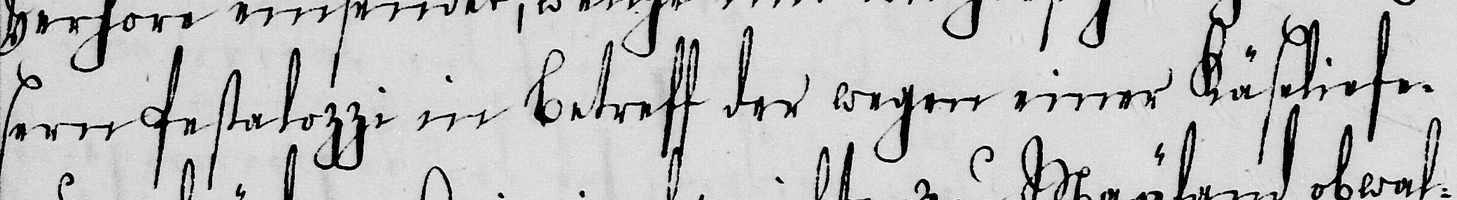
sern Pestalozzi in Betreff der wegen einer Käseliefe¬
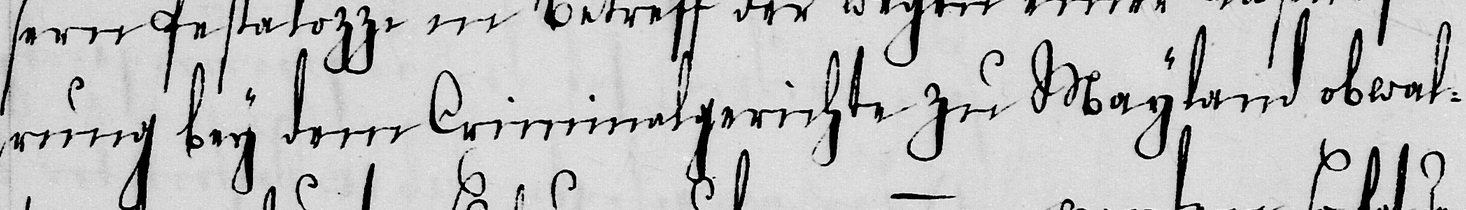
rung bey dem Criminalgerichte zu Mayland obwal¬
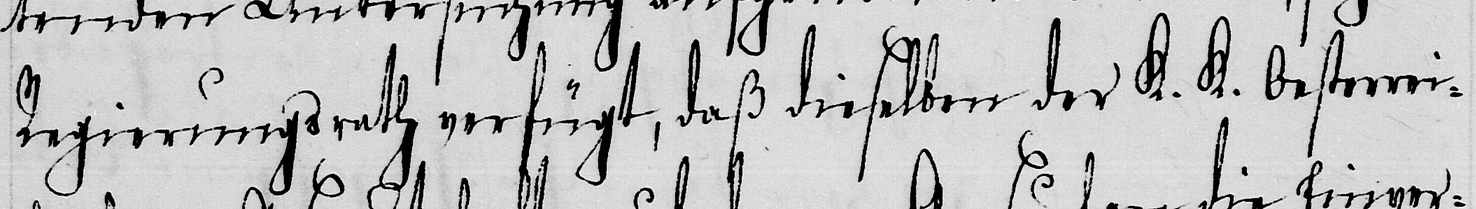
Regierungsrath verfügt, daß dieselben der K. K. Oesterrei¬
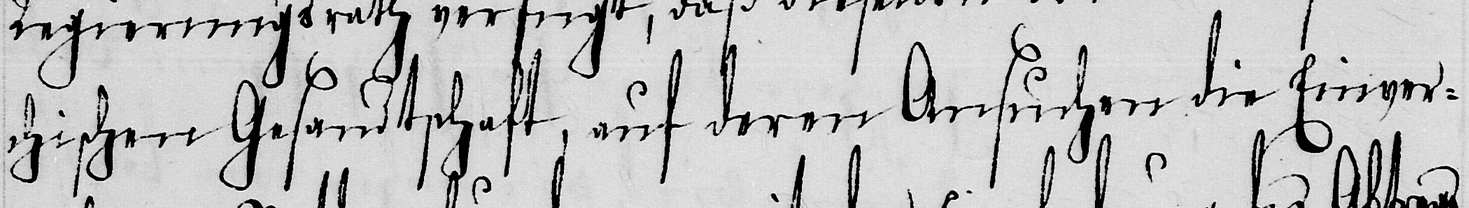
chischen Gesandtschaft, auf deren Ansuchen die Einver¬
